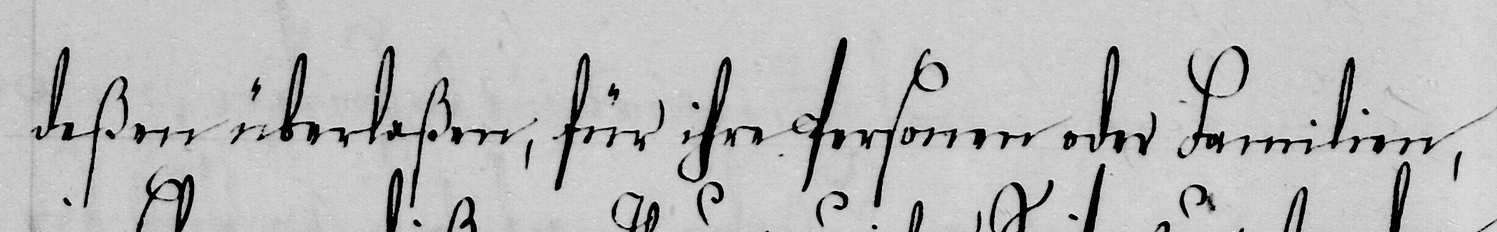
deßen überlaßen, für ihre Personen oder Familien,
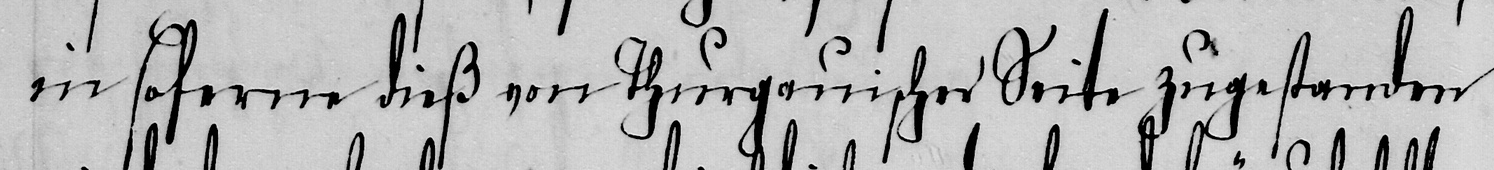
in soferne dieß von Thurgauischer Seite zugestanden
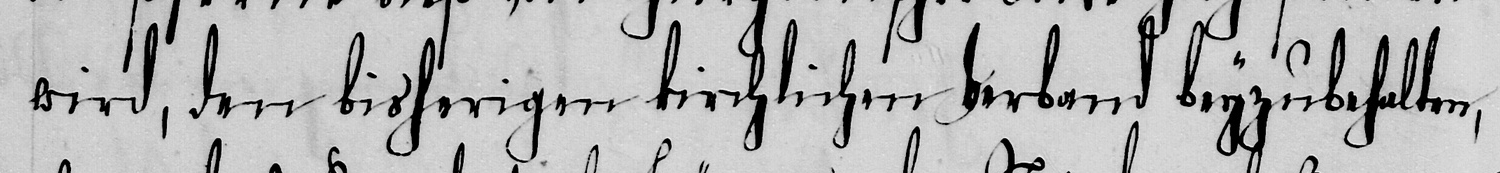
wird, den bisherigen kirchlichen Verband beyzubehalte¬
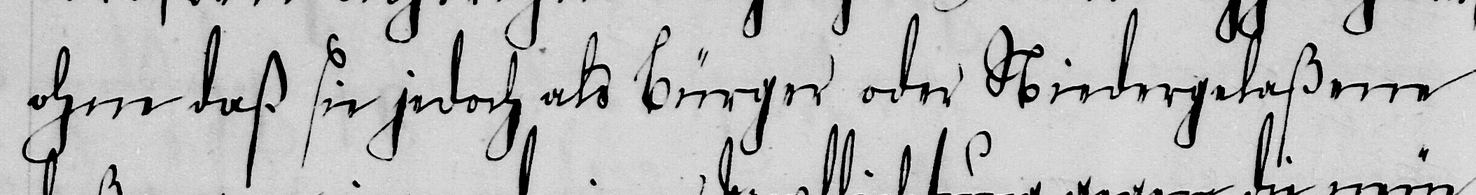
ohne daß sie jedoch als Bürger oder Niedergelaßene
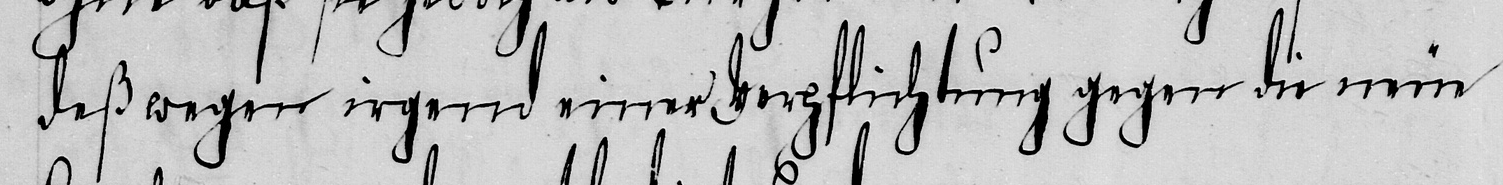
deßwegen irgen einer Verpflichtung gegen die neue
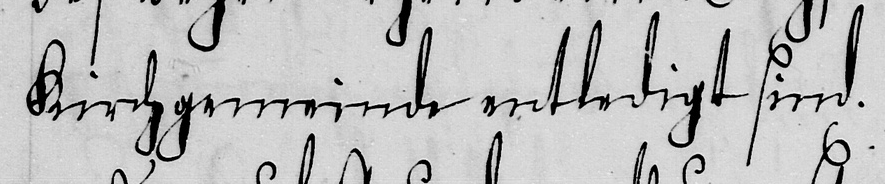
Kirchgemeinde entledigt sind.
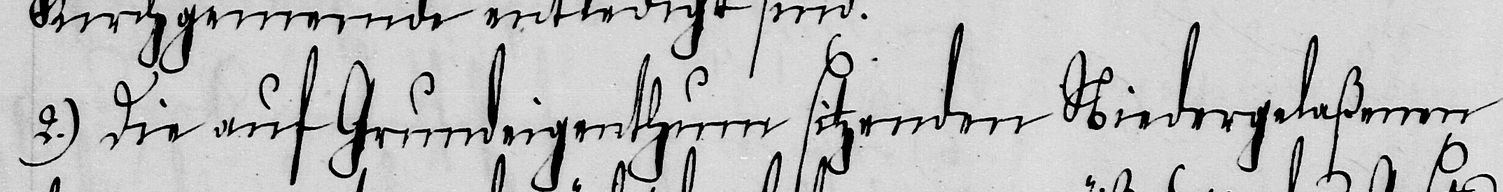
2.) Die auf Grundeigenthum sitzenden Niedergelaßenen
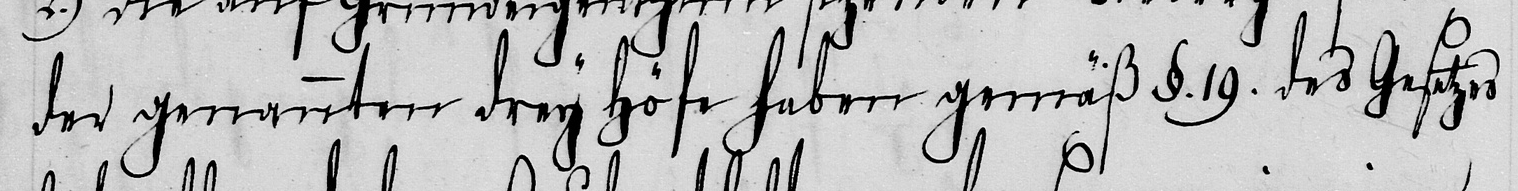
der genannten drey Höfe haben gemäß §. 19. des Gesetz¬
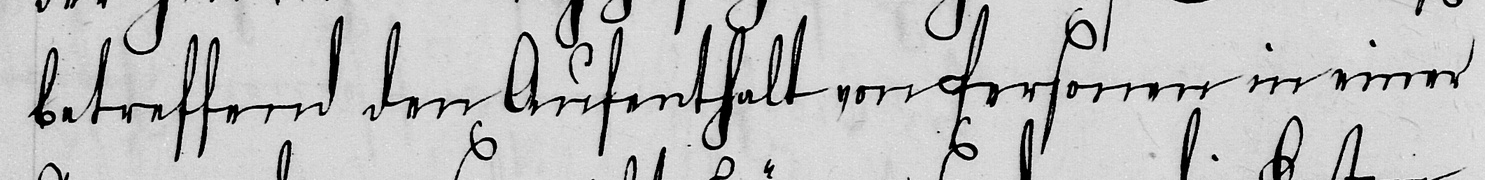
betreffend den Aufenthalt von Personen in einer
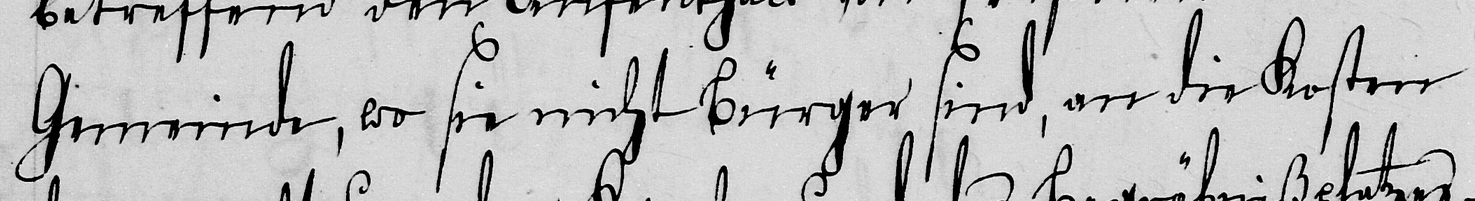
Gemeinde, wo sie nicht Bürger sind, an die Kosten
